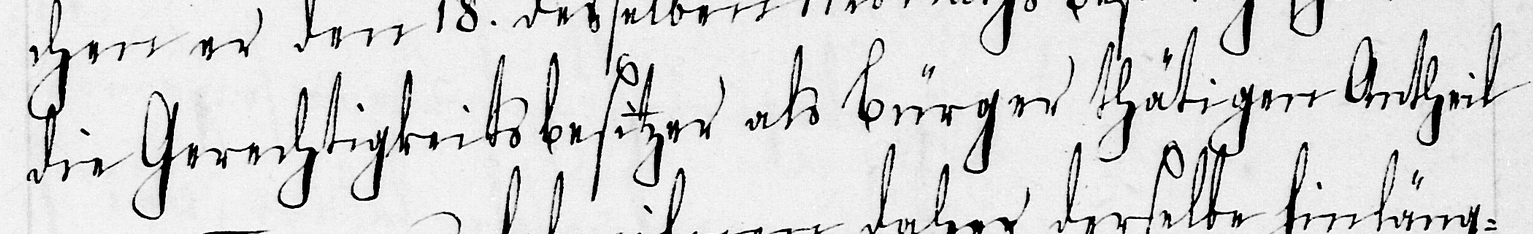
die Gerechtigkeitsbesitzer als Bürger thätigen Antheil
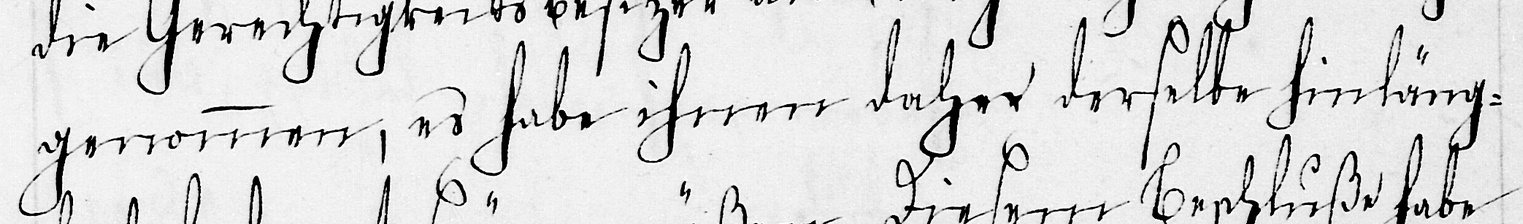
genommen, es habe ihnen daher derselbe hinläng¬
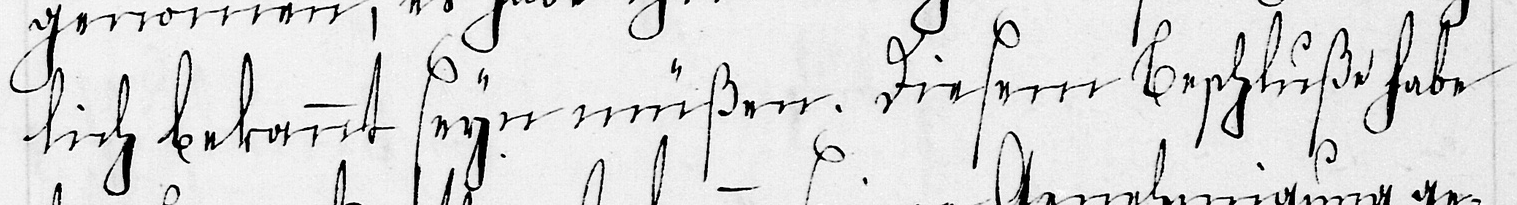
lich bekannt seyn müßen. Diesem Beschluße habe
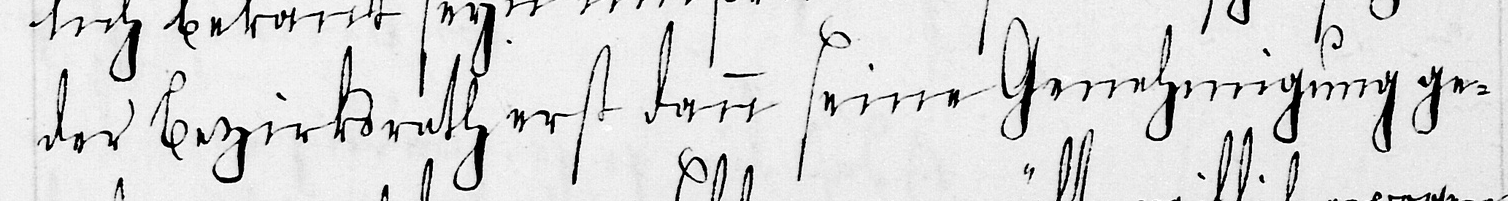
der Bezirksrath erst dann seine Genehmigung ge¬
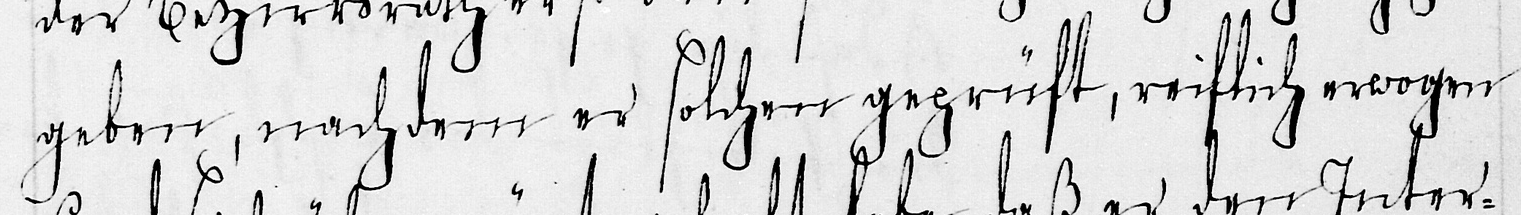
geben, nachdem er solchen geprüft, reiflich erwogen
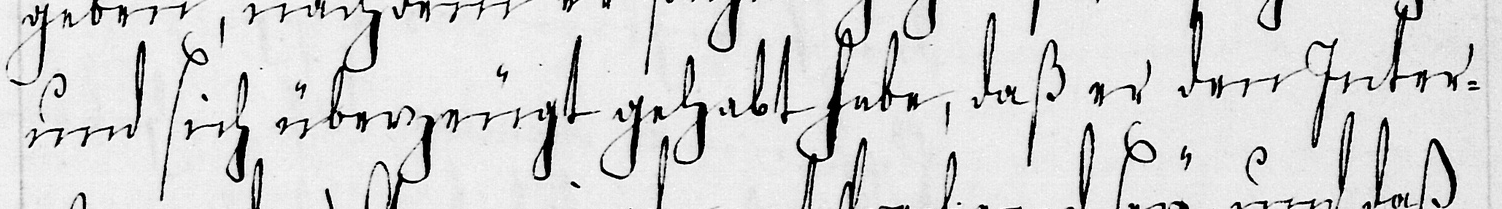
und sich überzeugt gehabt habe, daß er den Inter¬
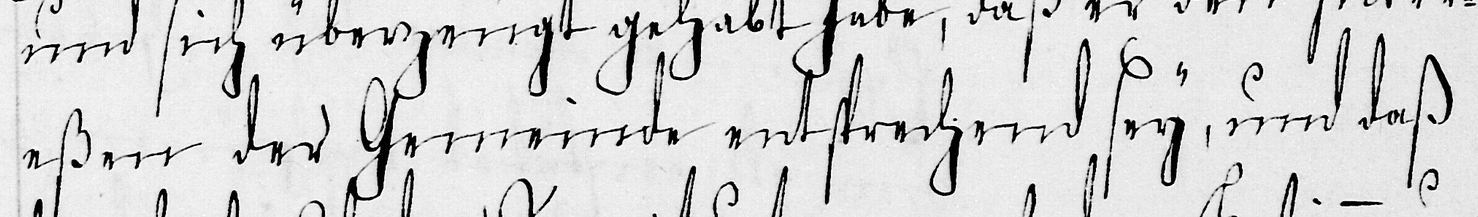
eßen der Gemeinde entsprechend sey, und daß
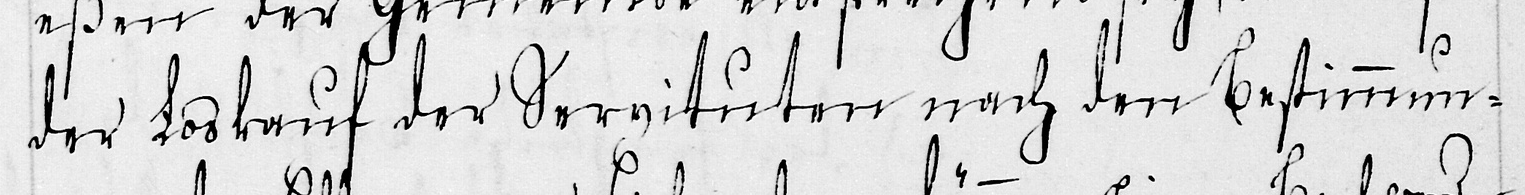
der Loskauf der Servituten nach den Bestimmun¬
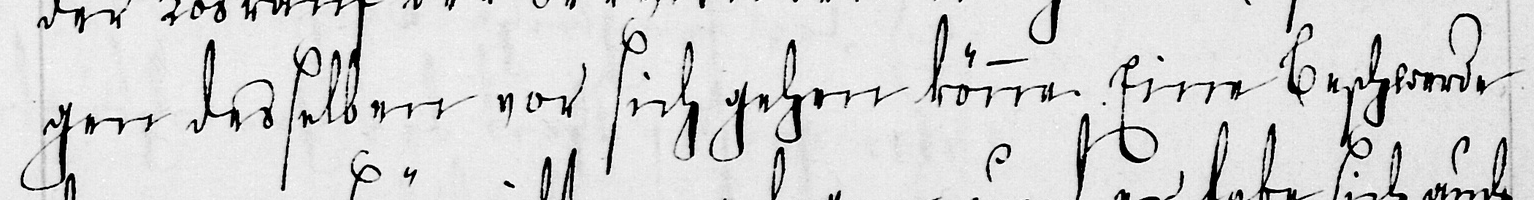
gen desselben vor sich gehen könne. Eine Beschwerde
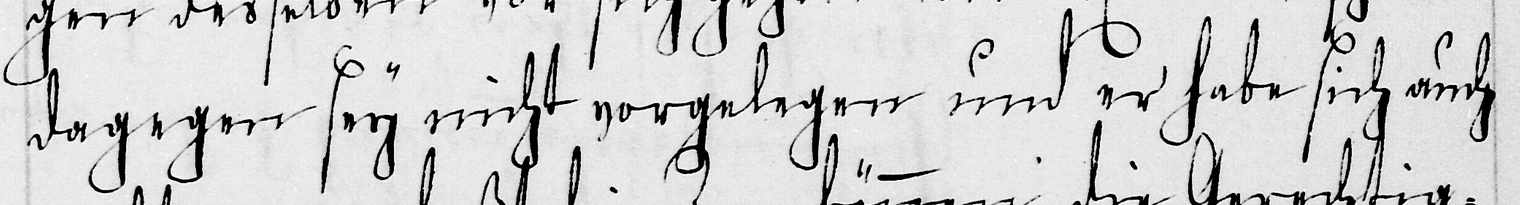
dagegen sey nicht vorgelegen und er habe sich auch
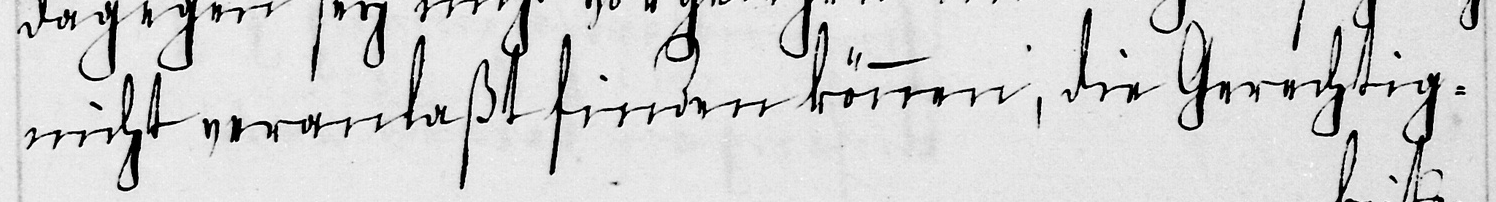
nicht veranlaßt finden können, die Gerechtig-
